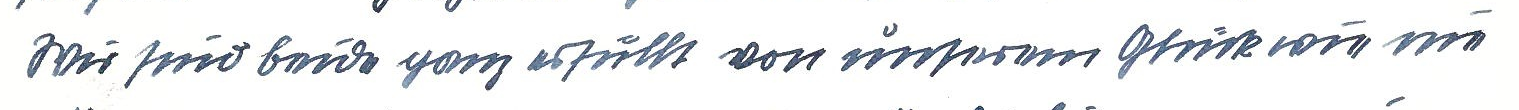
Wir sind beide ganz erfüllt von unserem Glück wie nie
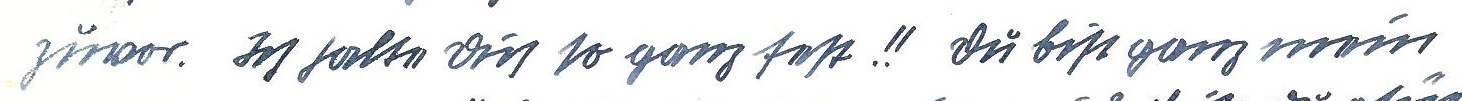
zuvor. Ich halte Dich so ganz fest!! Du bist ganz mein
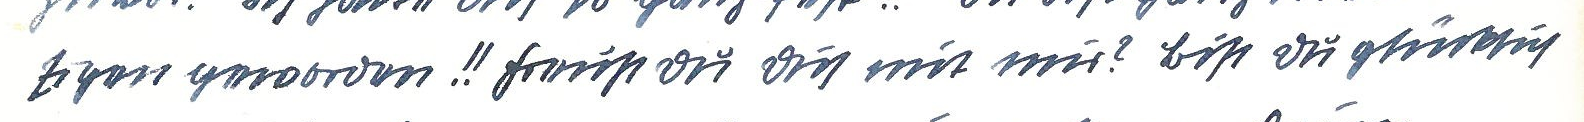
Eigen geworden!! Freust Du Dich mit mir? Bist Du glücklich
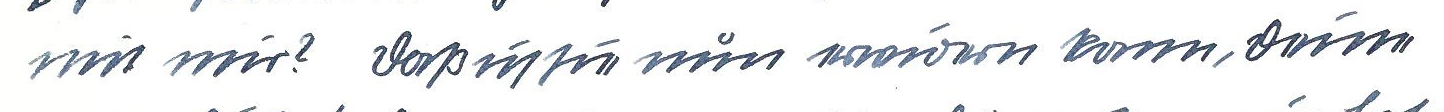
mit mir? Daß ich sie nun erwidern kann, Deine
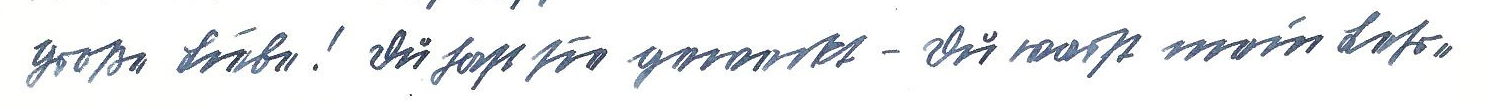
große Liebe! Du hast sie geweckt – Du warst mein Lehr¬
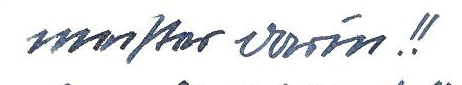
meister darin!!
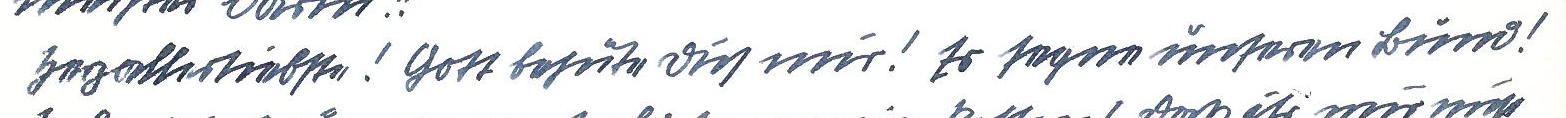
Herzallerliebste! Gott behüte Dich mir! Er segne unseren Bund!
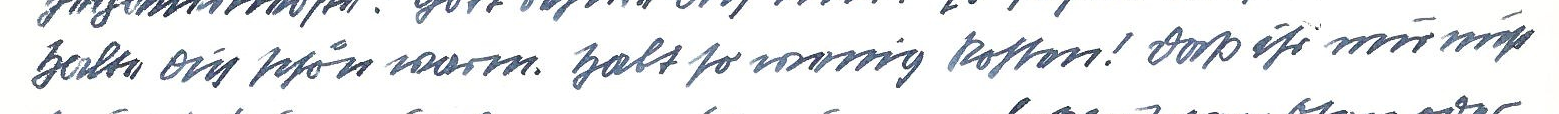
Halte Dich schön warm. Habt so wenig Kohlen! Daß Ihr mir nicht
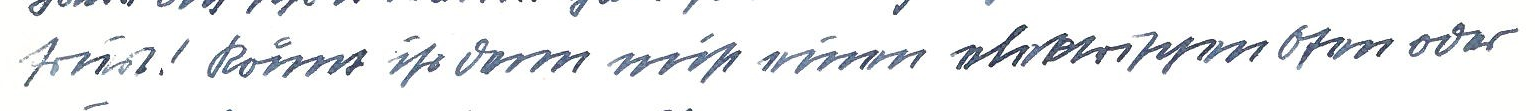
friert! Könnt Ihr denn nicht einen elektrischen Ofen oder
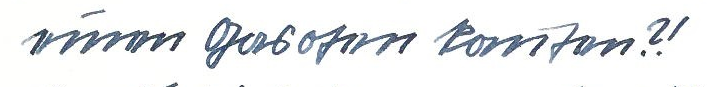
einen Gasofen kaufen?!
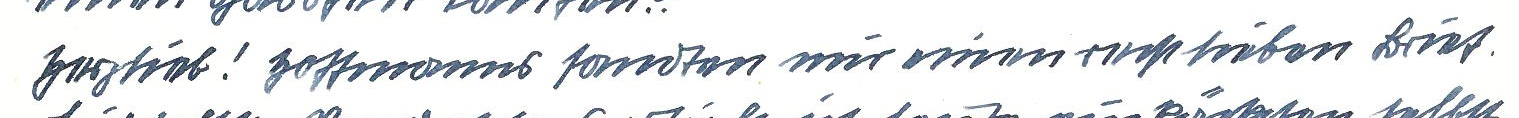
Herzlieb! Hoffmanns sandten mir einen recht lieben Brief.
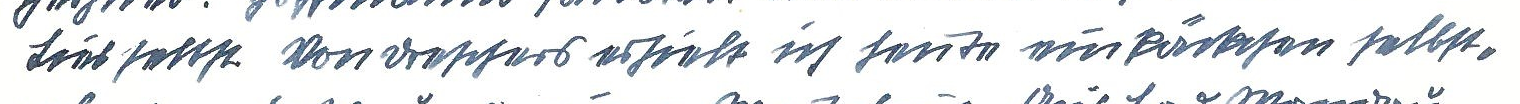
Lies selbst. Von Dreschers erhielt ich heute ein Päckchen selbst¬
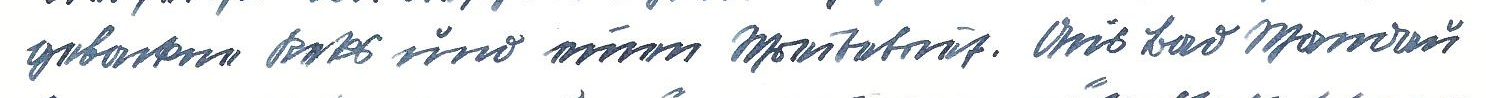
gebackne Keks und einen Schreibebrief. Aus B.
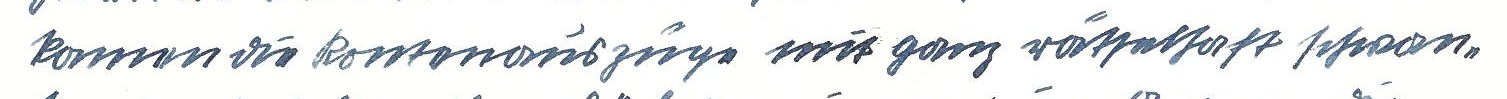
kamen die Kontenauszüge mit ganz rätselhaft schwan¬
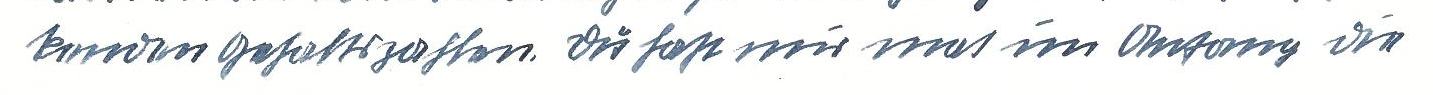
kenden Gehaltszahlen. Du hast mir mal im Anfang die
